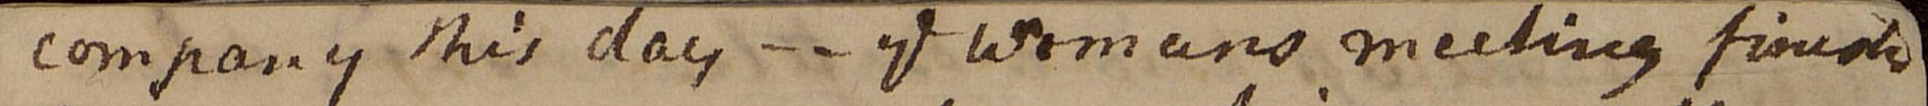company this day-- y^e womans meeting finish
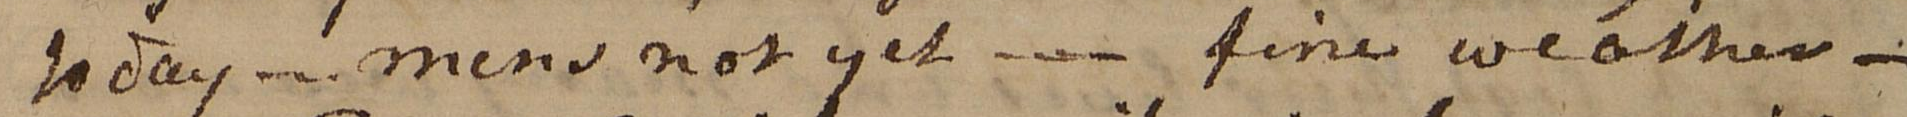today- mens not yet- fine weather-
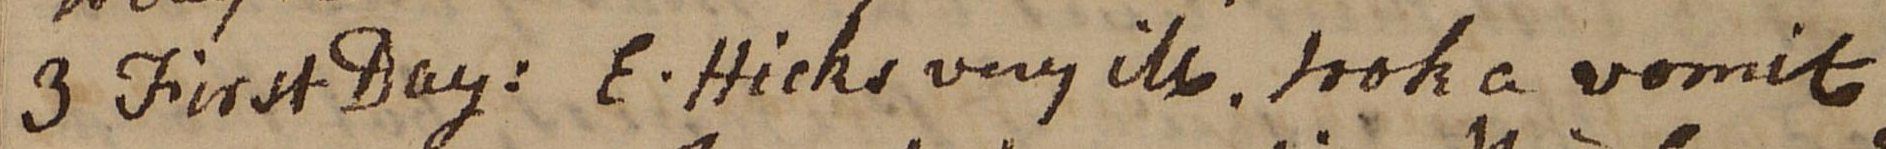3 First Day: E. Hicks very ill, took a vomit
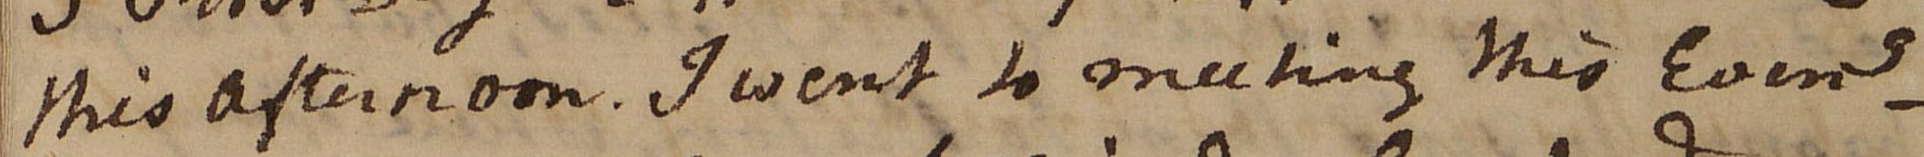this afternoon. I went to meeting this Even^g-
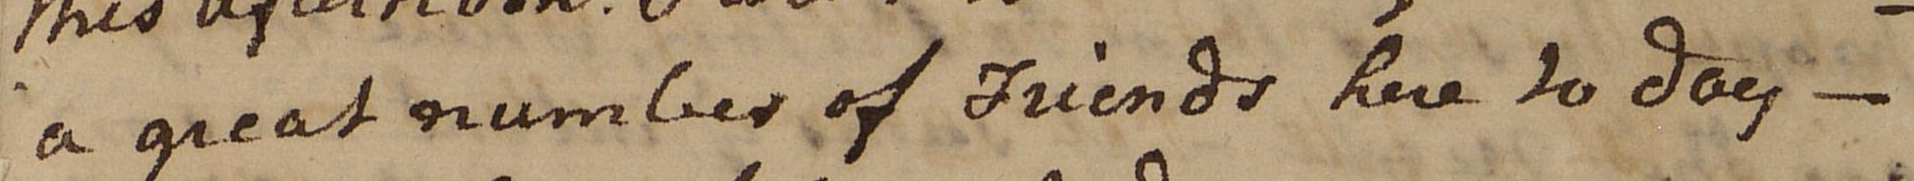a great number of Friends here to day-
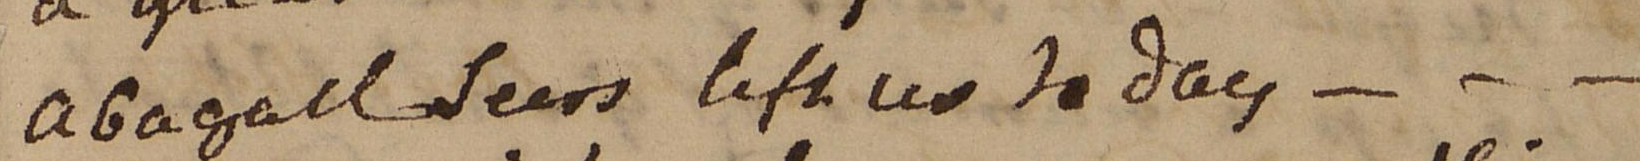Abagall Seers left us to day---
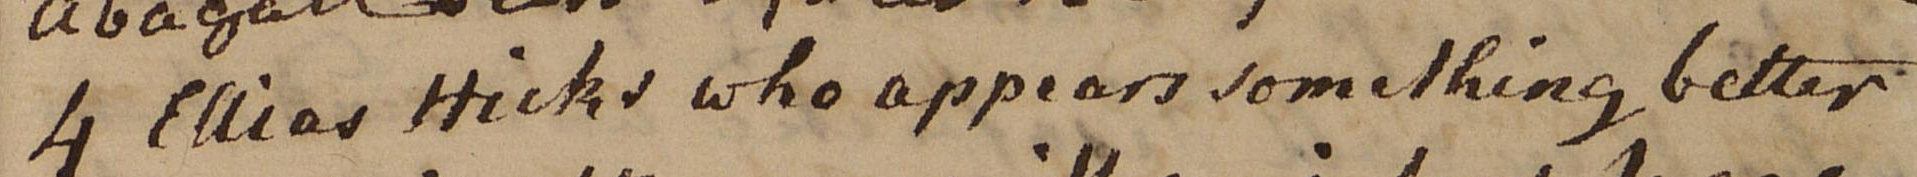4 Elias Hicks who appears something better
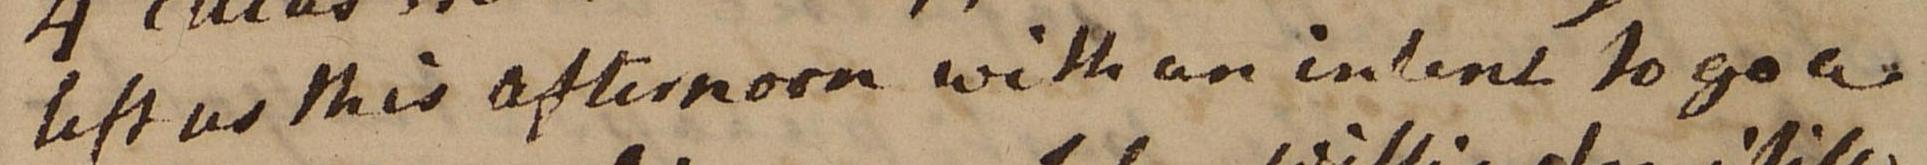left us this afternoon with an intent to go a
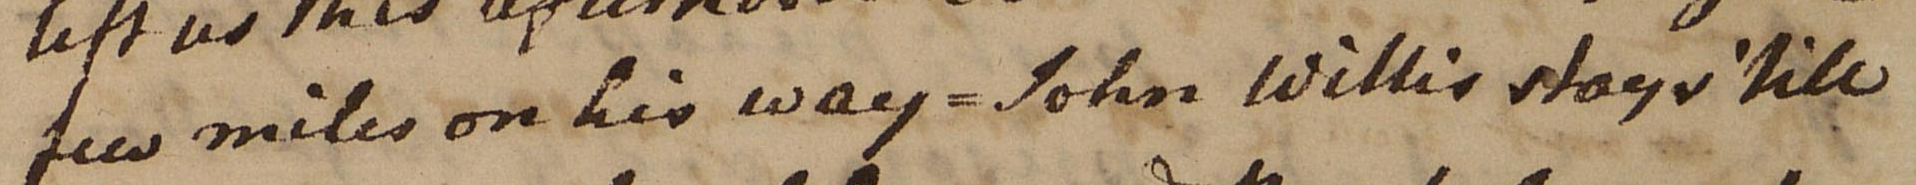few miles on his way- John Willis stays 'till
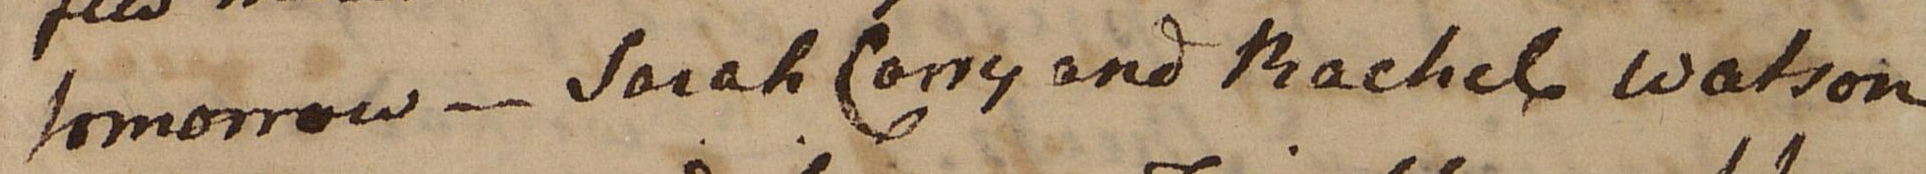tomorrow- Sarah Carry and Rachel Watson
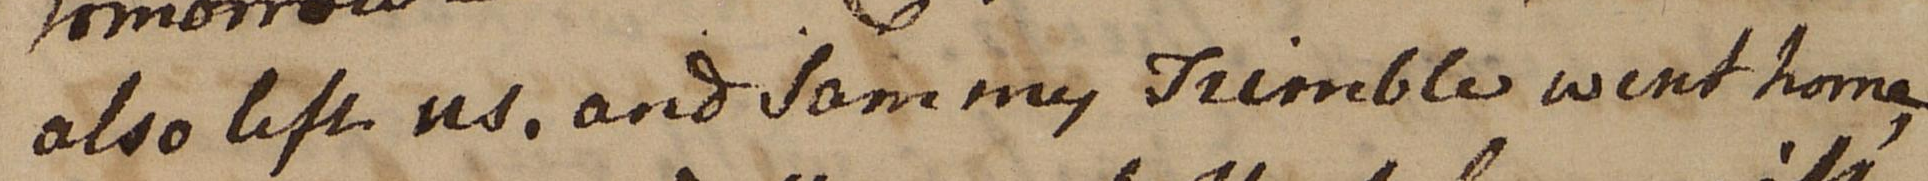also left us. and Sammy Trimble went home,
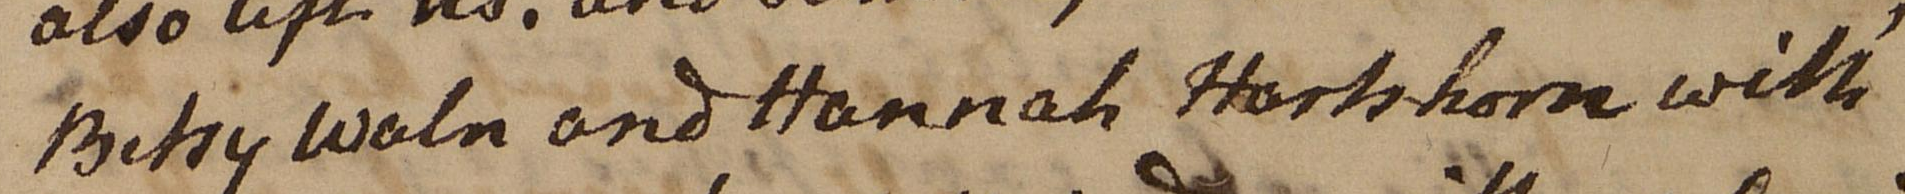Betsy Waln and Hannah Hartshorn with
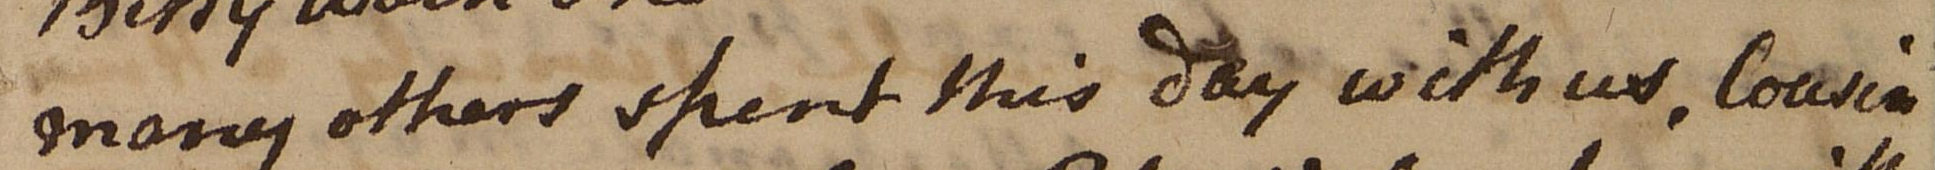many others spent this day with us, Cousin
